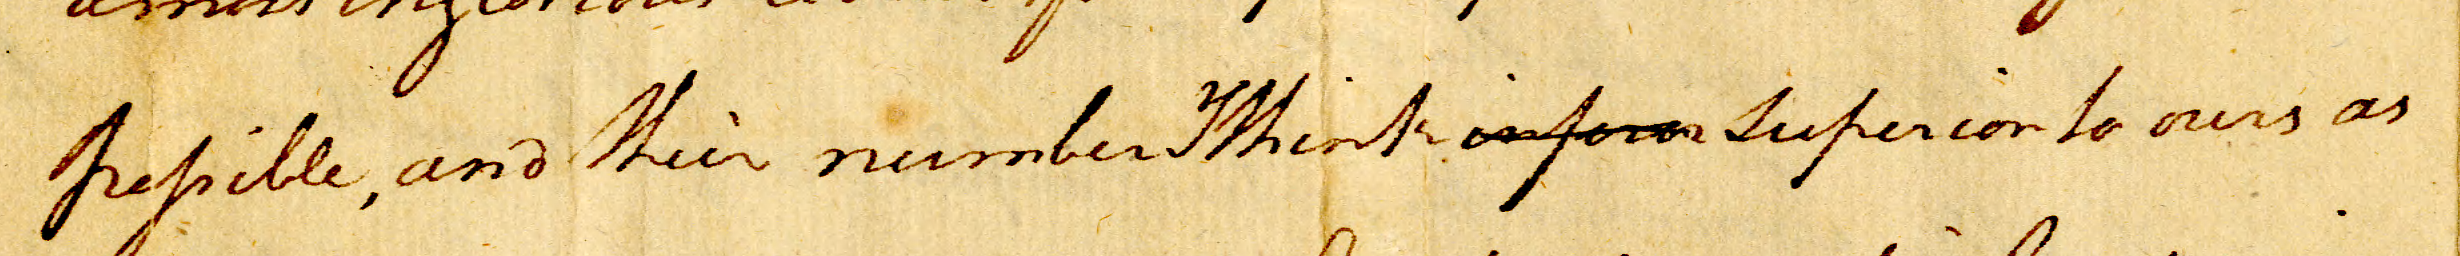possible, and their number I think superior to ours as
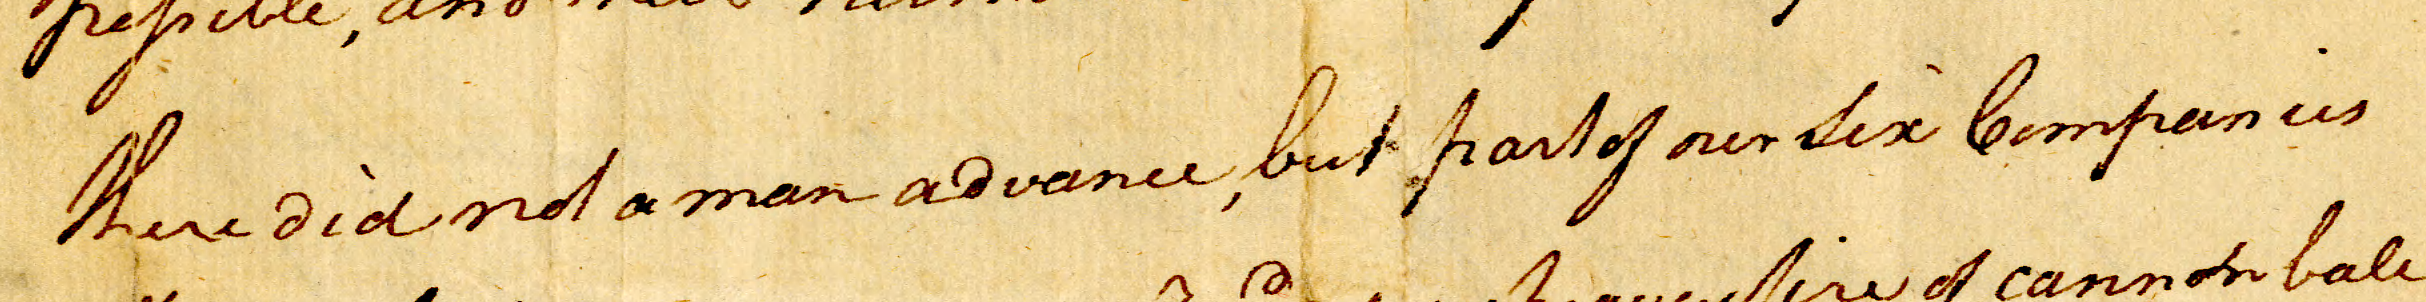there did not a man advance but part of our six Companies
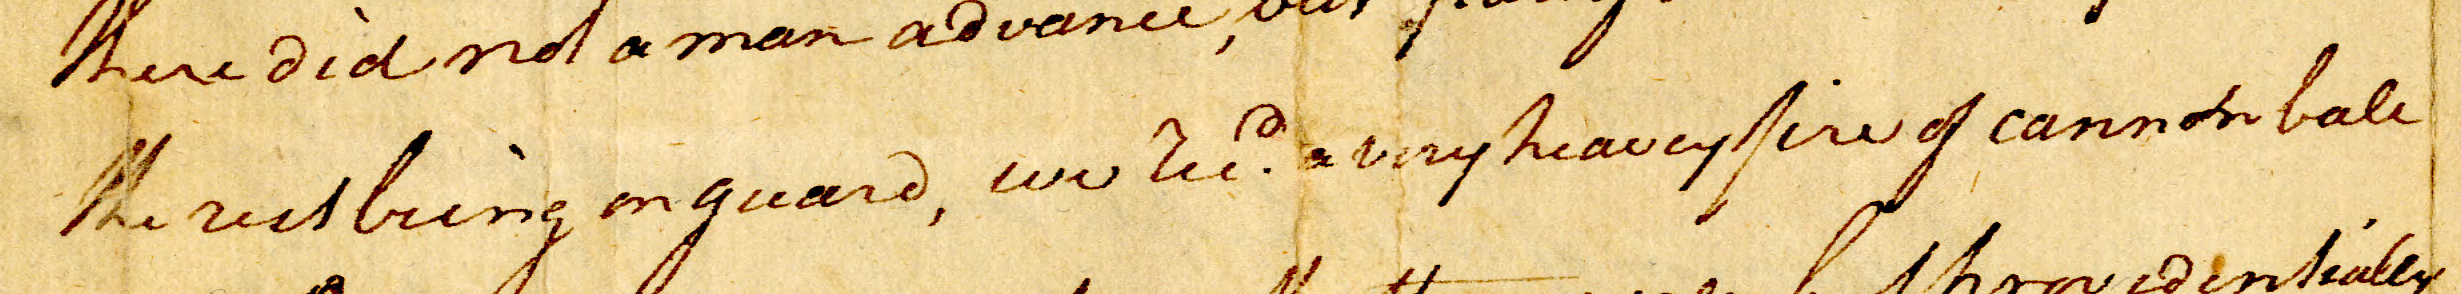the rest being on guard, we rec^d. a very heavy fire of cannon ball
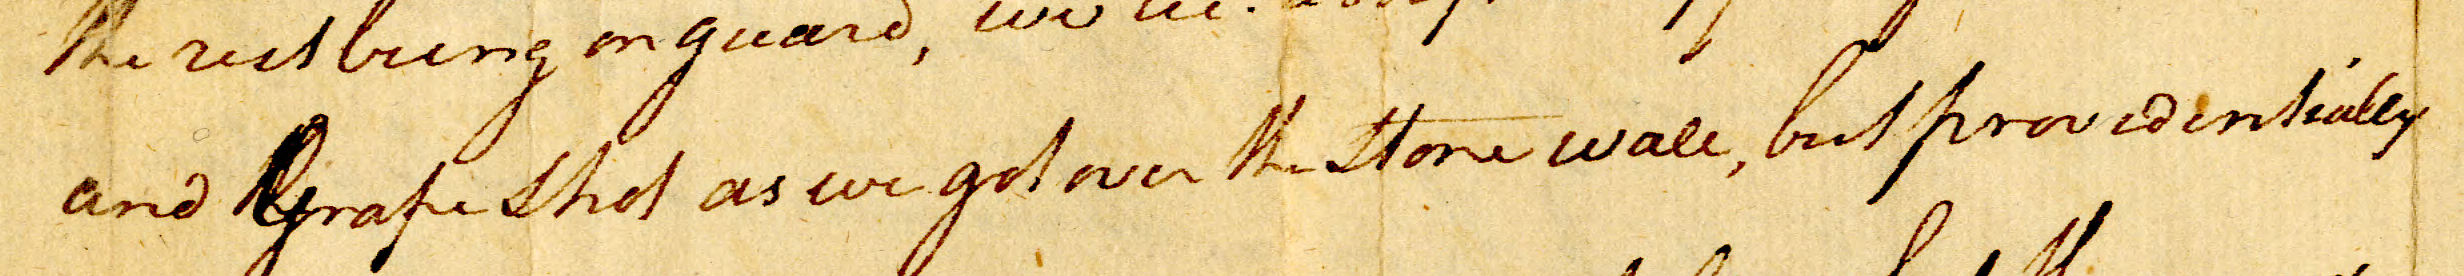and Grape shot as we got over the stone wall, but providentially
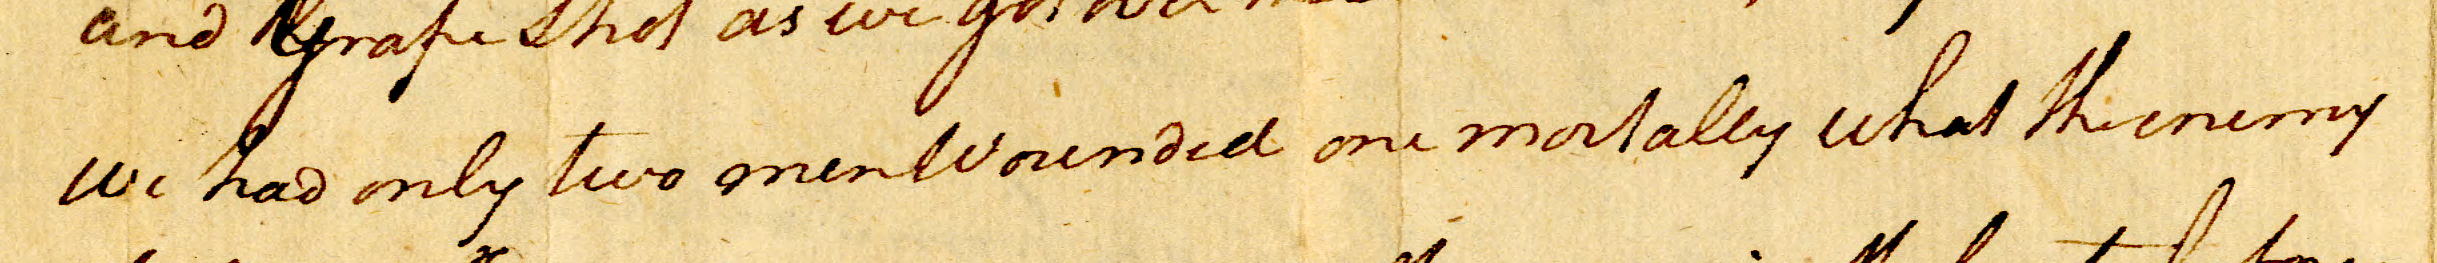we had only two men wounded one mortally what the enemy
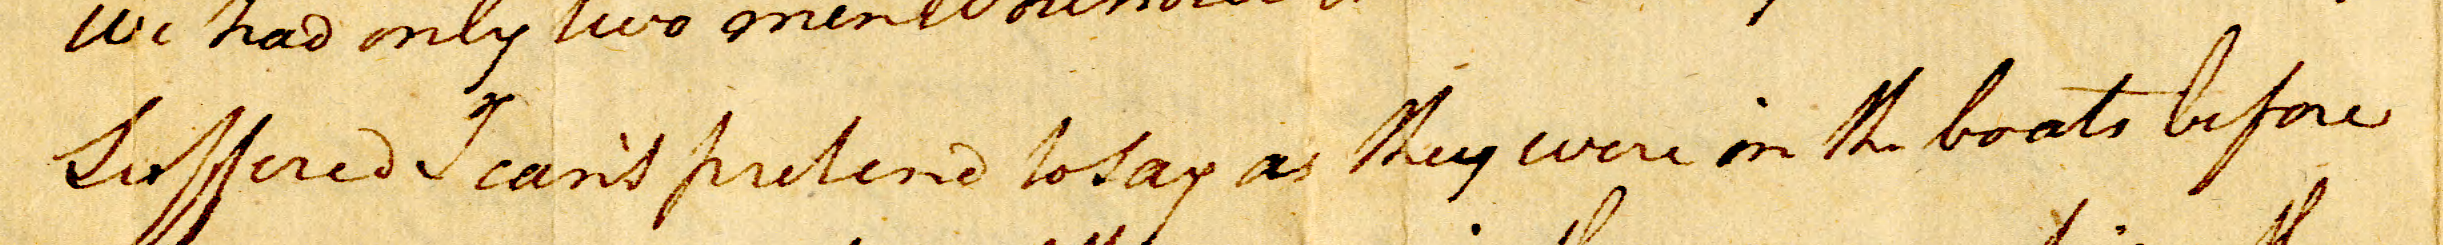Suffered I can't pretend to say as they were in the boats before
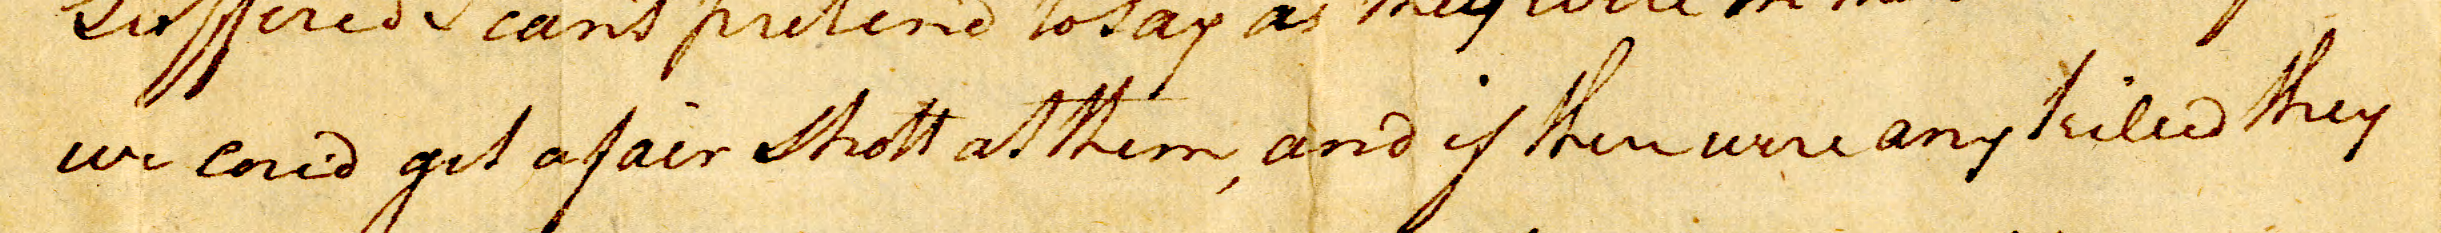we cou'd get a fair shott at them, and if there were any killed they
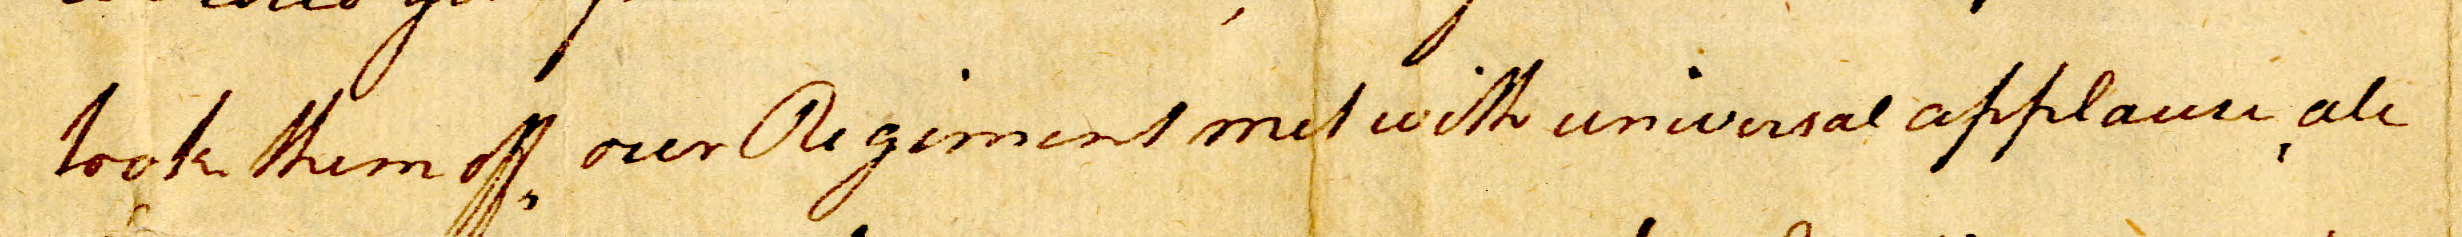took them off, our Regiment met with universal applause all
